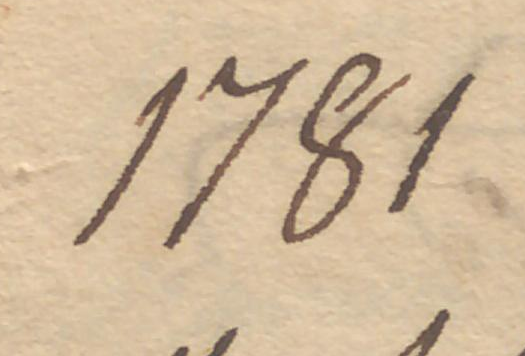1781
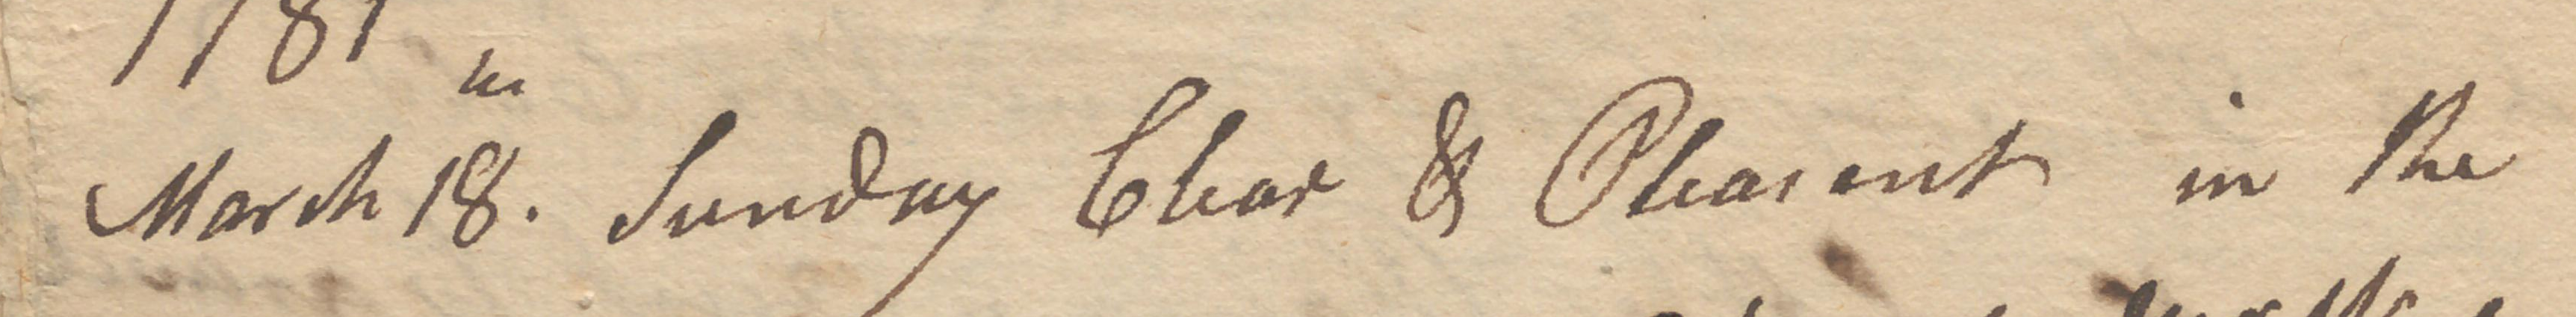March 18^th. Sunday Clear & Pleasent in the
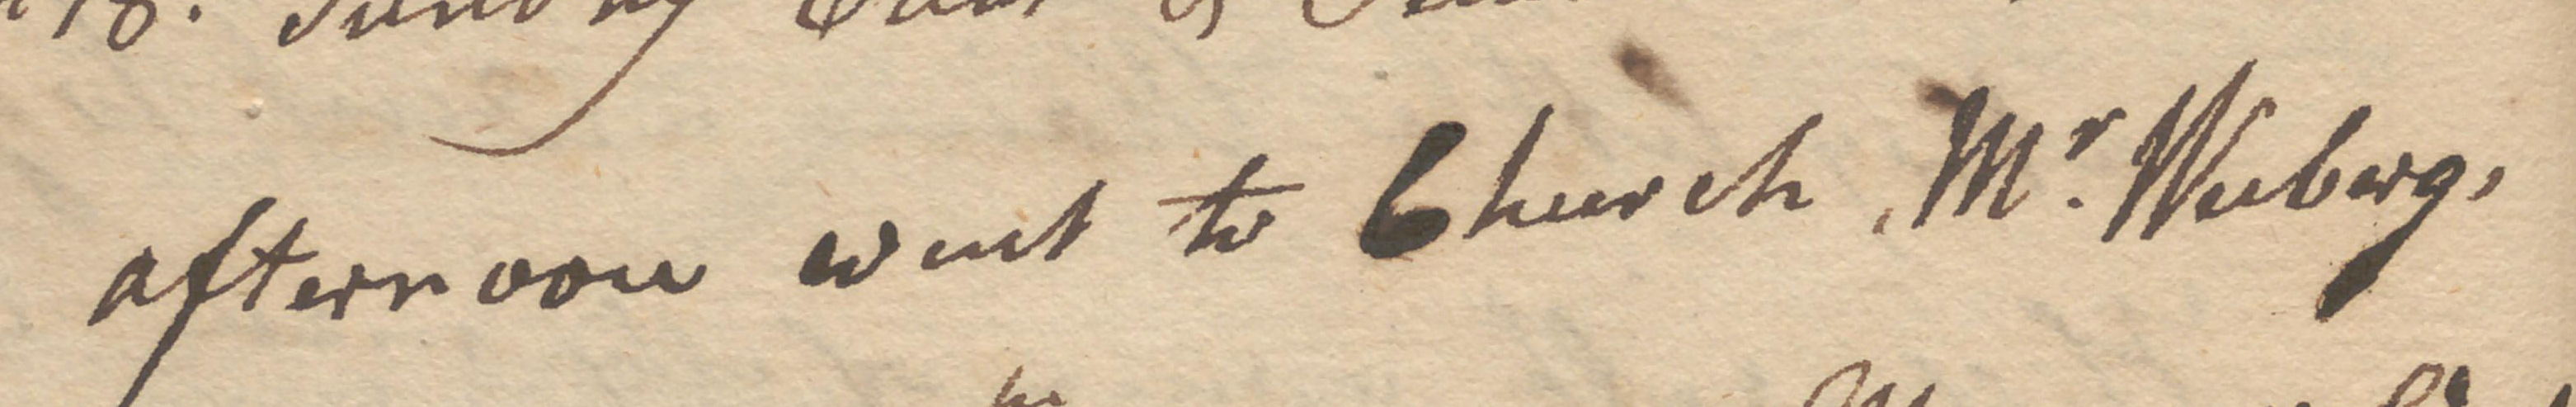afternoon went to Church, M^r. Weibergs
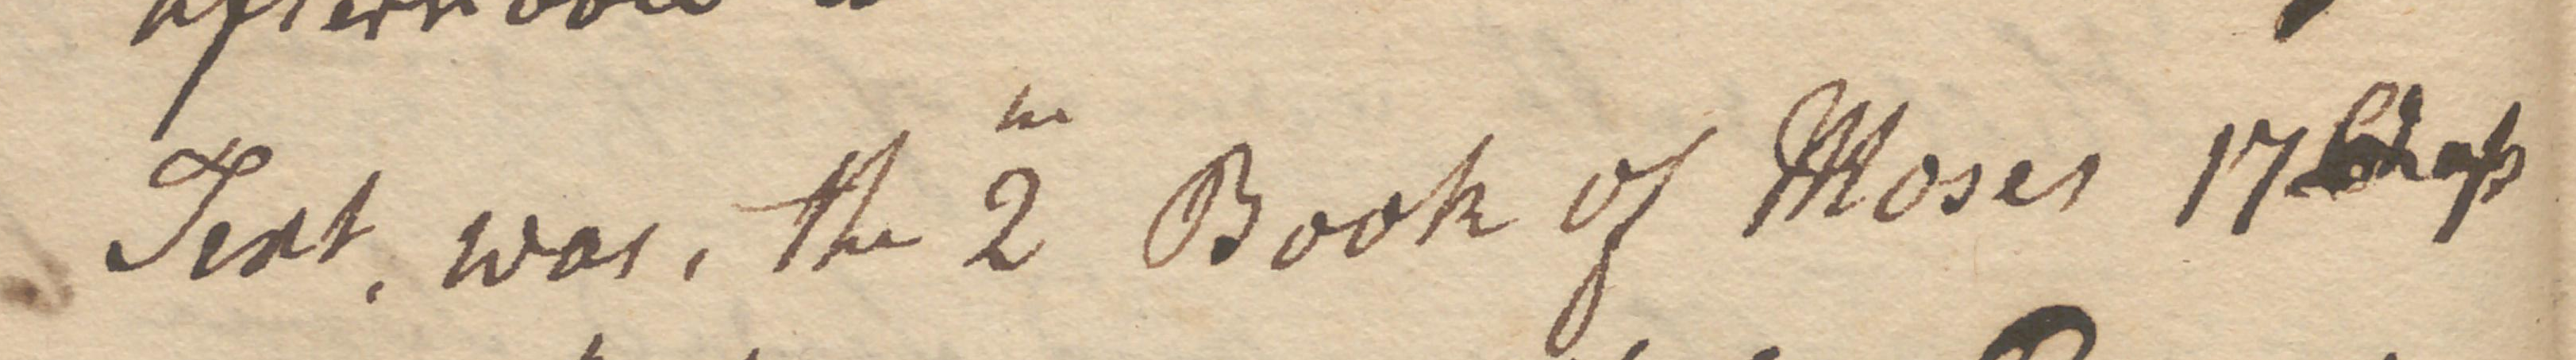Text. was, the 2^th Book of Moses 17 Chap
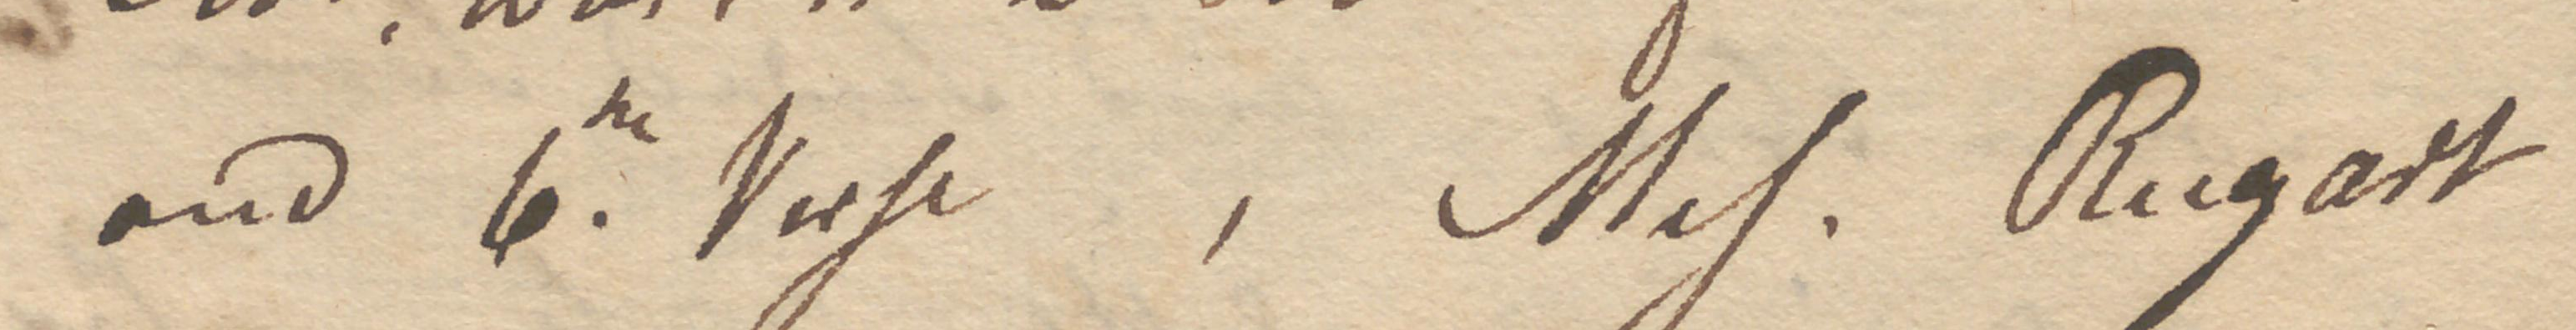and 6^th. Verse, Mes. Reigart
